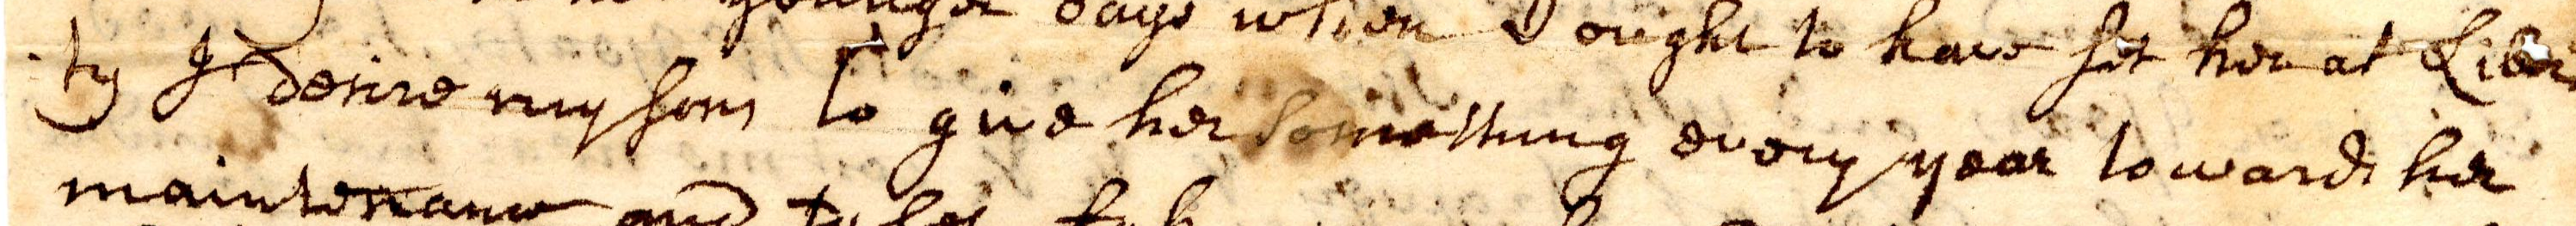-ty I desire my sons to give her something every year towards her
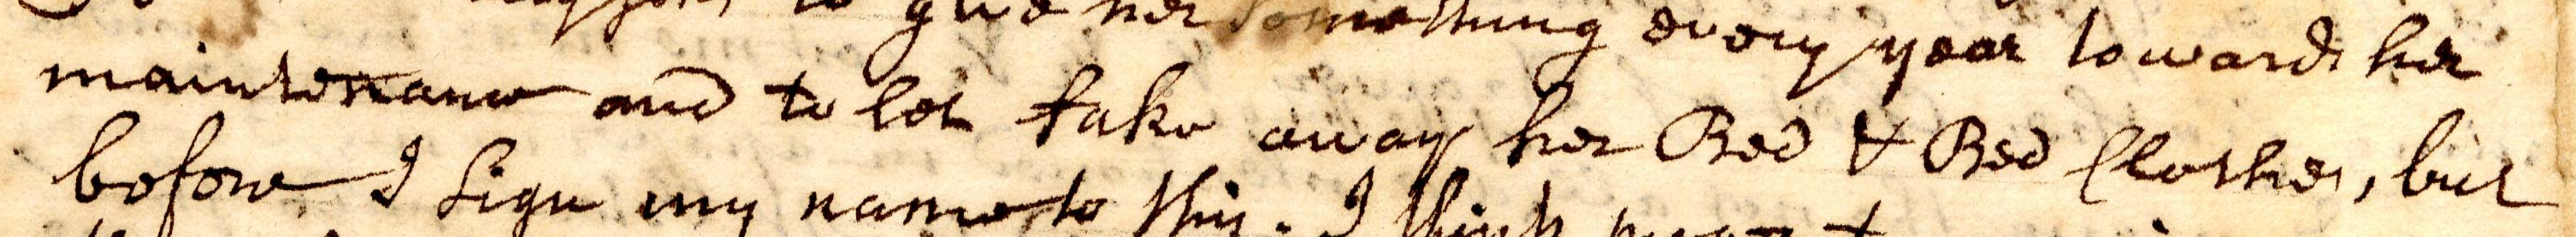maintenance and to let take away her Bed & Bed Clothes, but
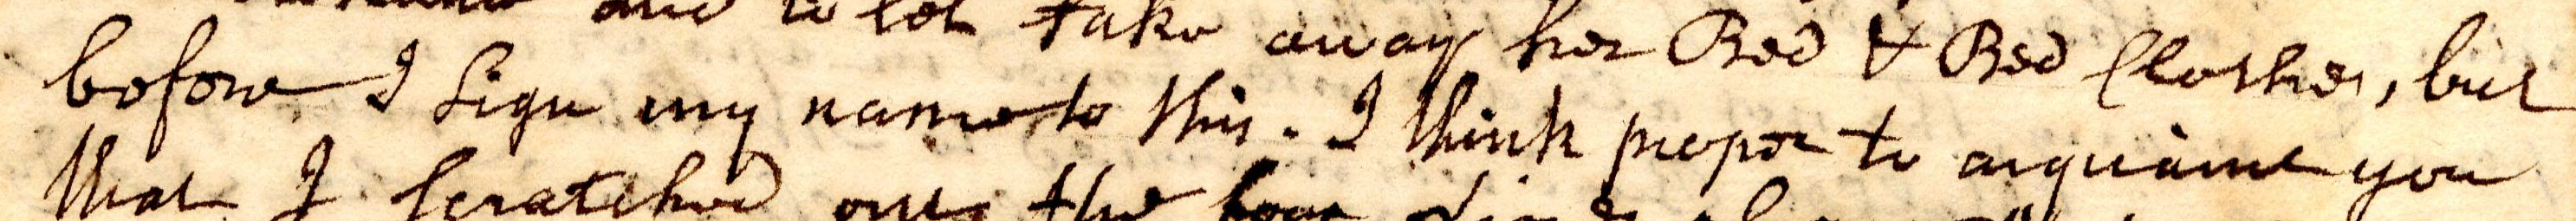before I Sign my name to this. I think proper to acquaint you
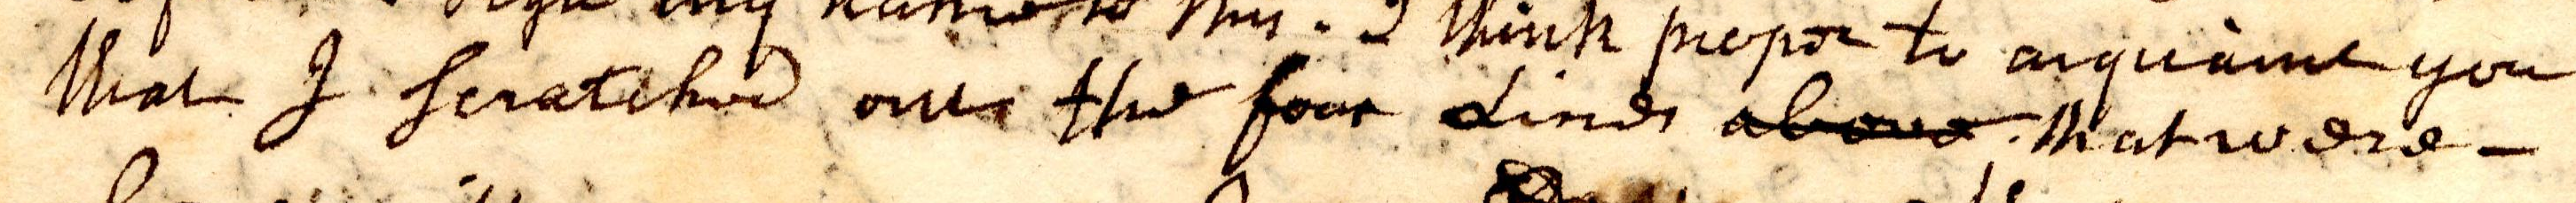that I scratched out the four Lines [above] that were-
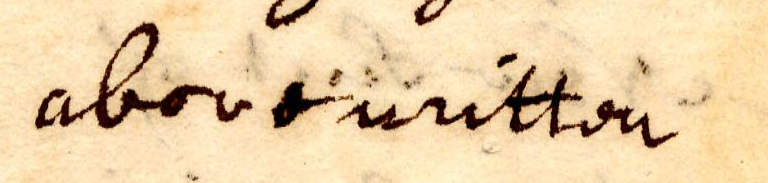above written
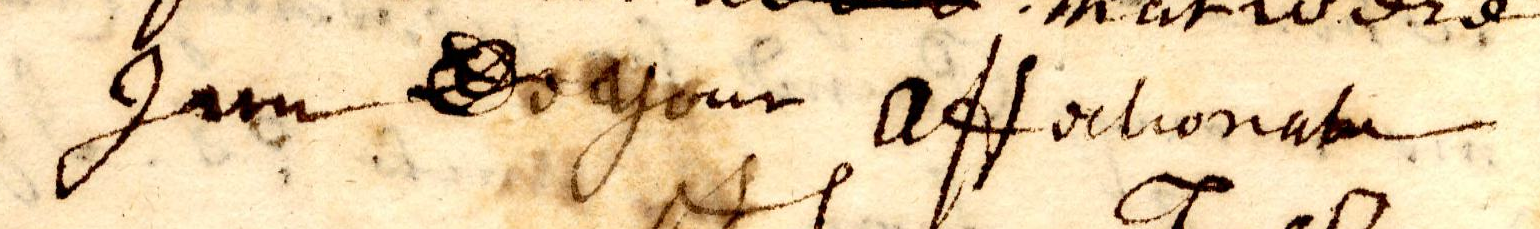I am [_] Your affectionate
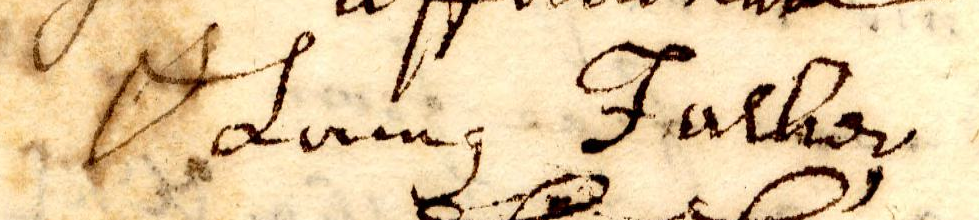& Loving Father,
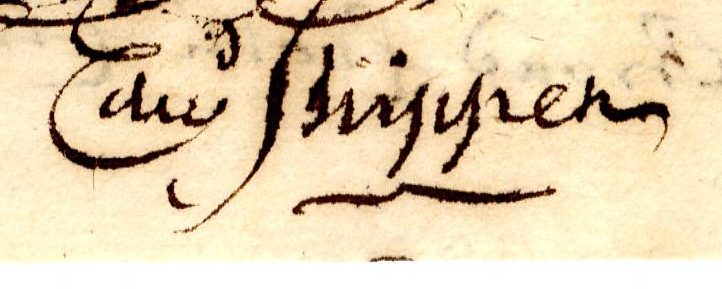Edw^d Shippen
